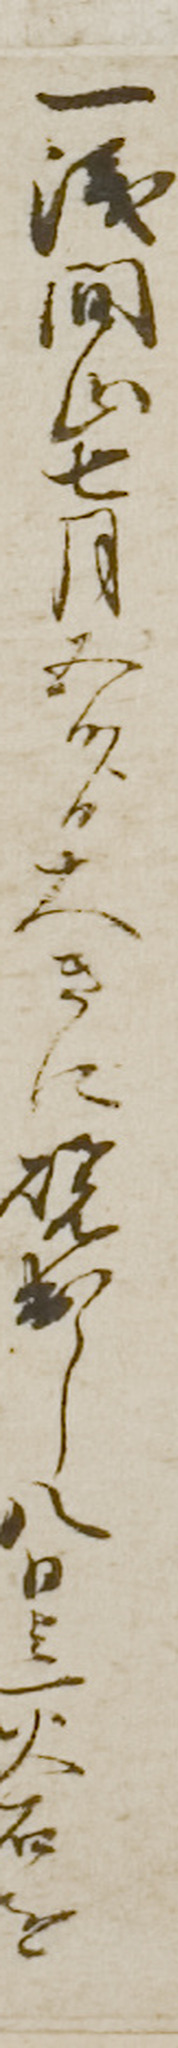一浅間山七月五日ゟ大きに焼出し八日迄火石を
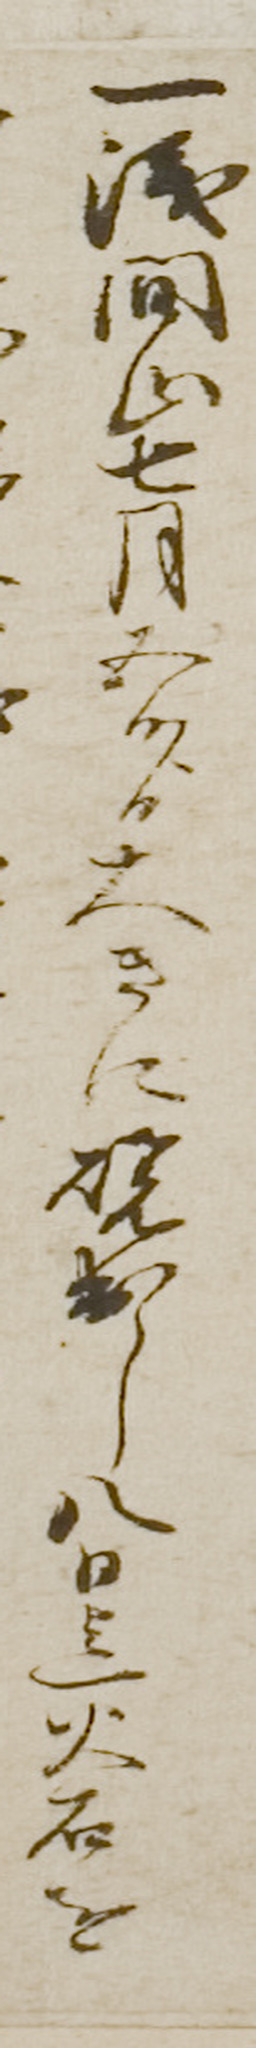一浅間山七月五日ゟ大きに焼出し八日迄火石を
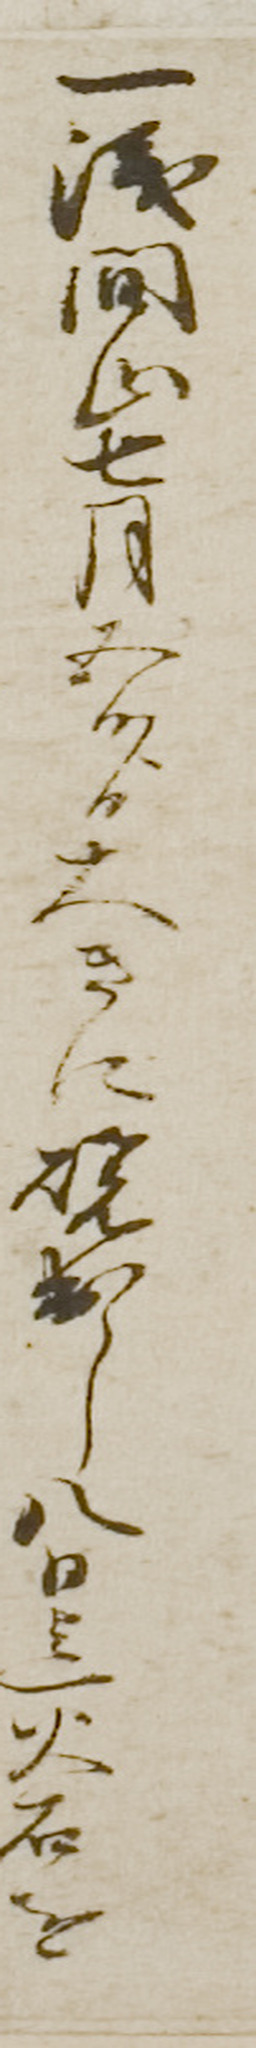一浅間山七月五日ゟ大きに焼出し八日迄火石を
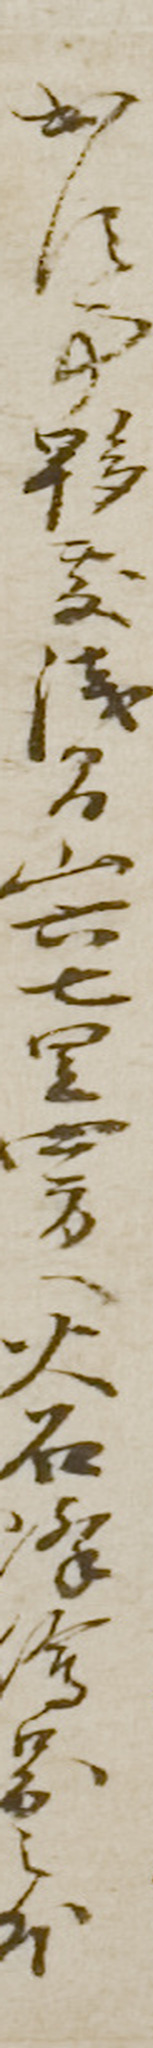出す事夥敷浅間山六七里四方へ火石降絵図之外
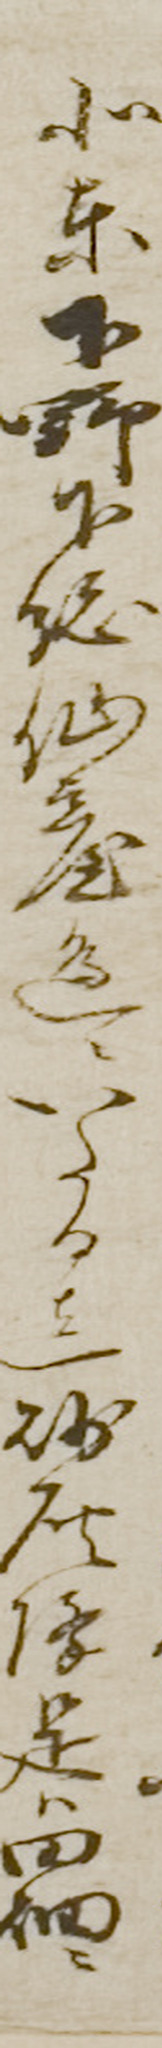北東下野下総仙台辺二いたる迄砂灰降是ハ田畑二
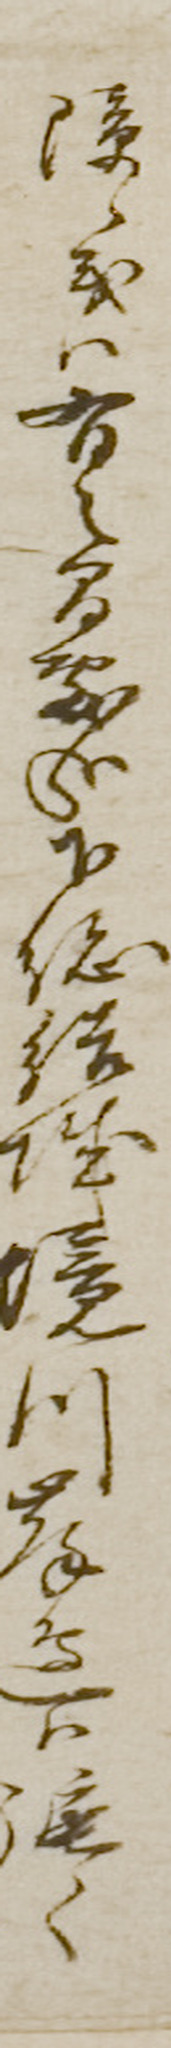障候義ハ有之間敷哉下総結城境川岸辺ハ濃く
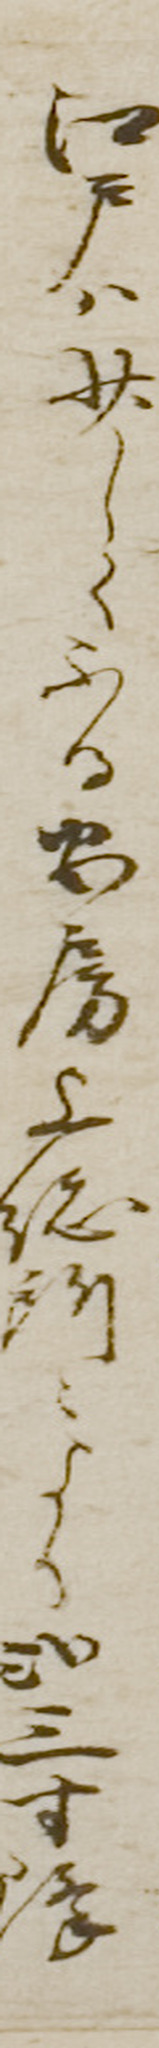江戸ハ少しくふる安房上総所々より弐三寸降
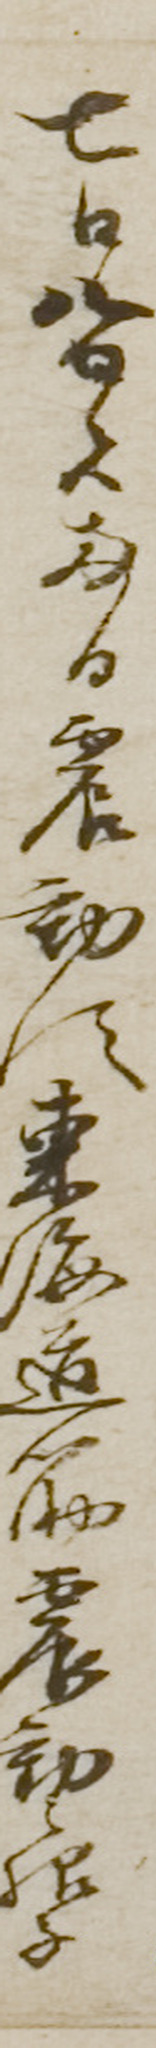七日八日ハ両日震動す東海道筋震動様子
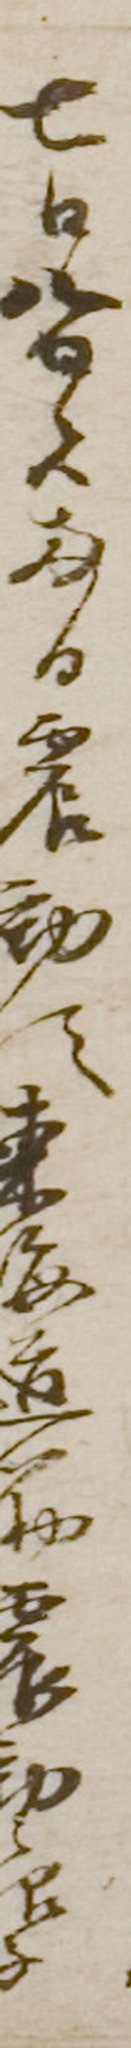七日八日ハ両日震動す東海道筋震動様子
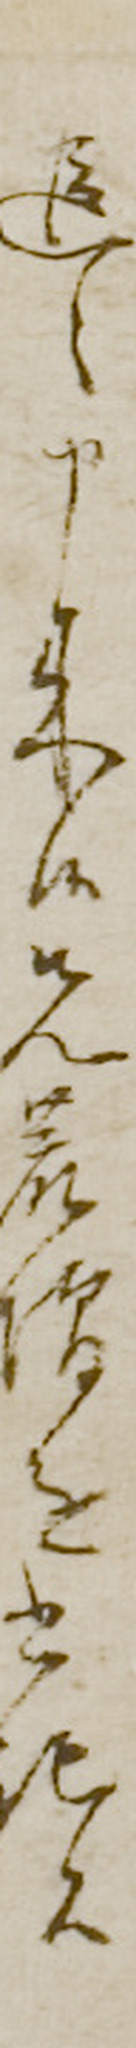追々申来候先荒増を書記ス
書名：[天明三年浅間山噴火]
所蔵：東京大学総合図書館 General Library in the University of Tokyo, JAPAN
